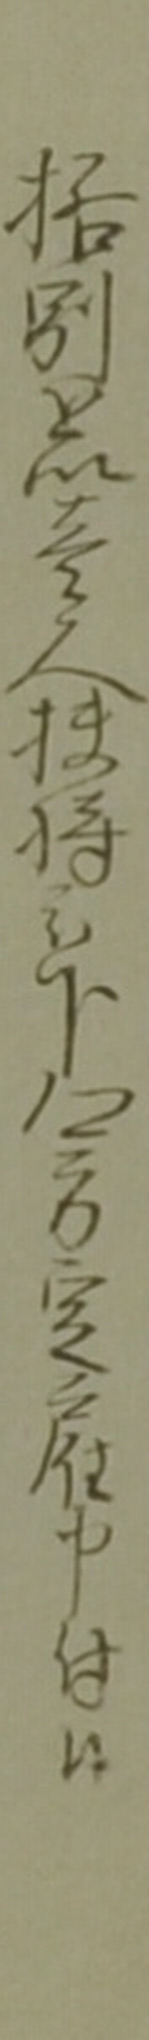格別を以壱人扶持被下郷方定雇申付候
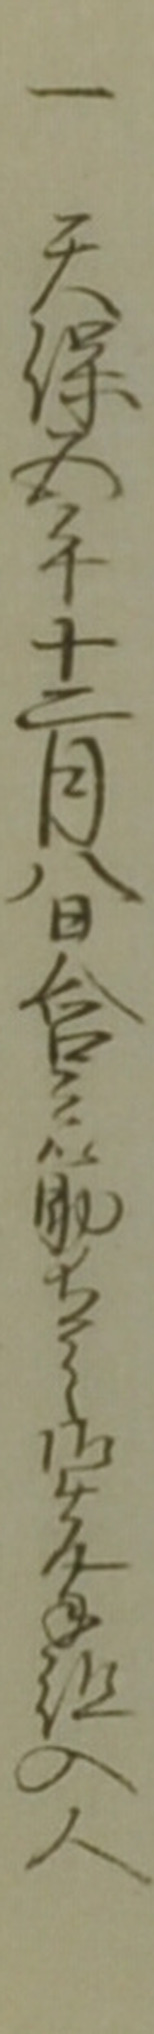一天保五午十二八日含之筋有之御先手組入人
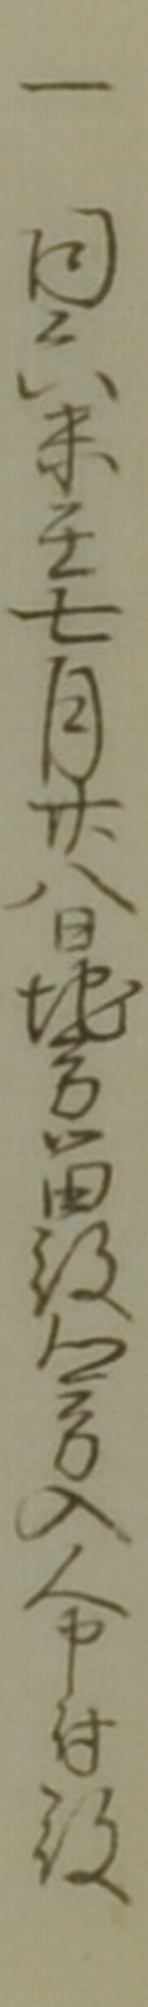一同六未閏七月廿八日地方留役郷方入人申付役
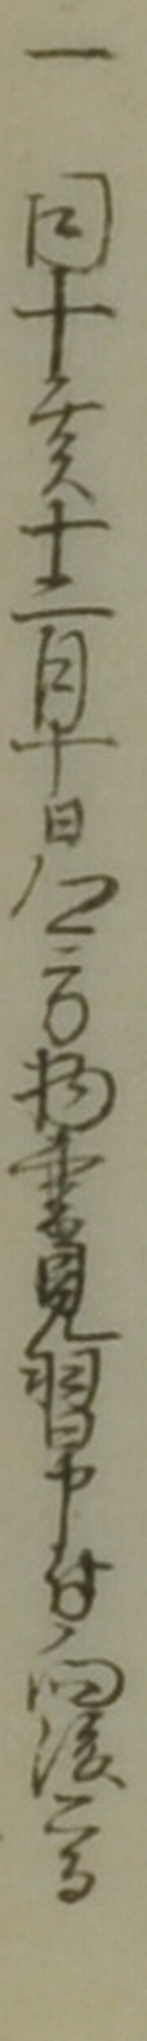一同十亥十二月十日郷組物書見習申付向後高
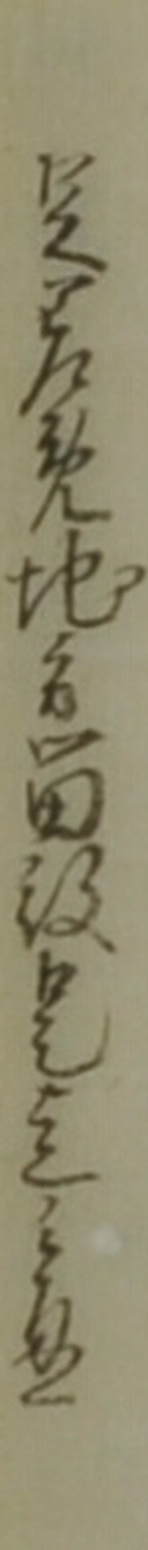足差免地方留役是迄之通
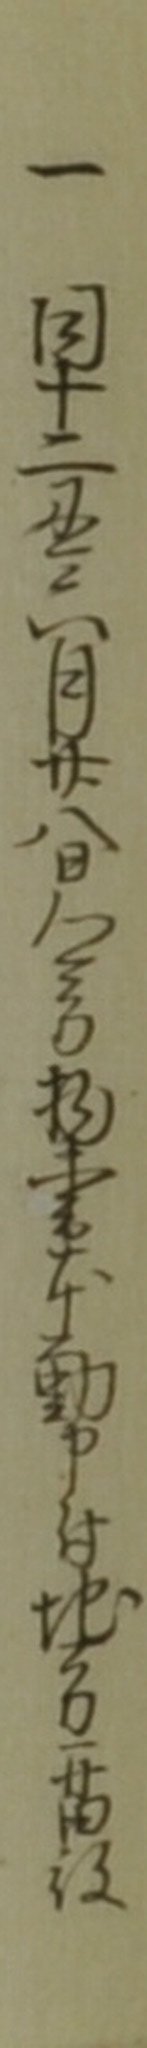一同十二丑六月廿八日郷方物書本勤申付地方留役
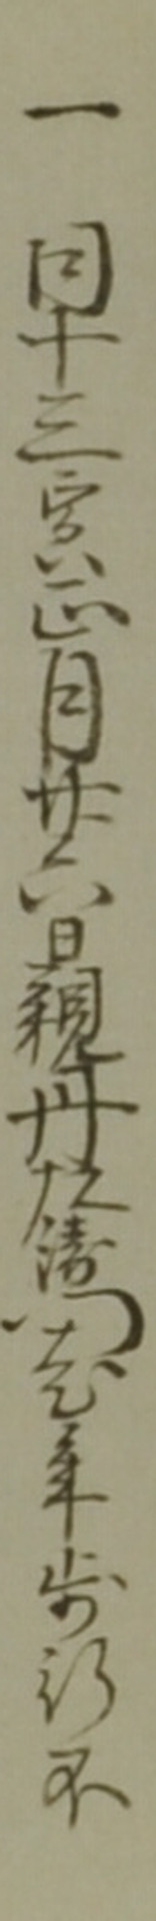一同十三寅正月廿六日親丹左衛門老年歩行不
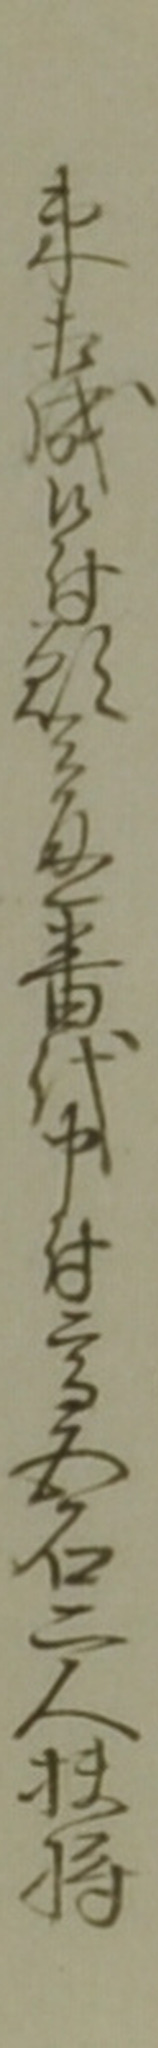束相成候付願之通番代申付高五石二人扶持
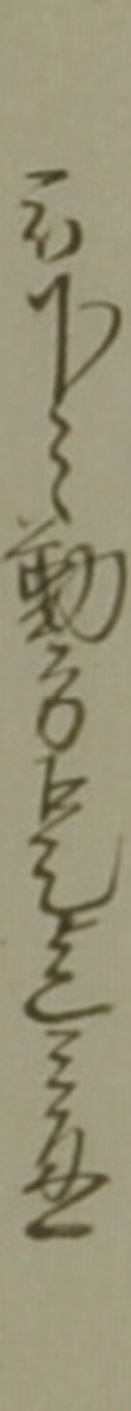被下之勤方是迄之通
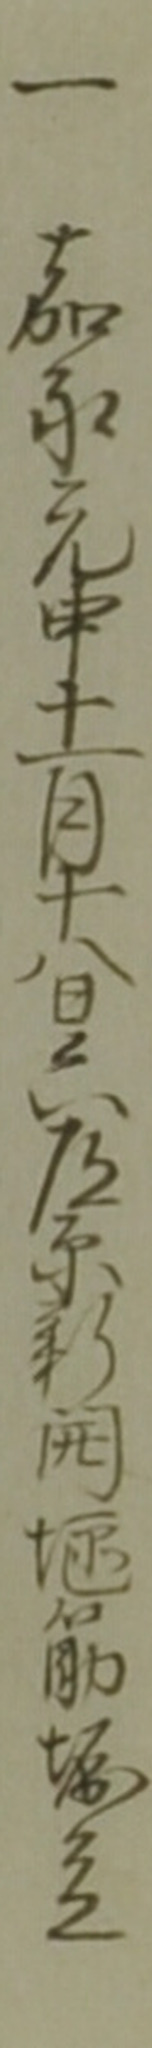一嘉永元申十一月十八日六道原新開塸筋堀立
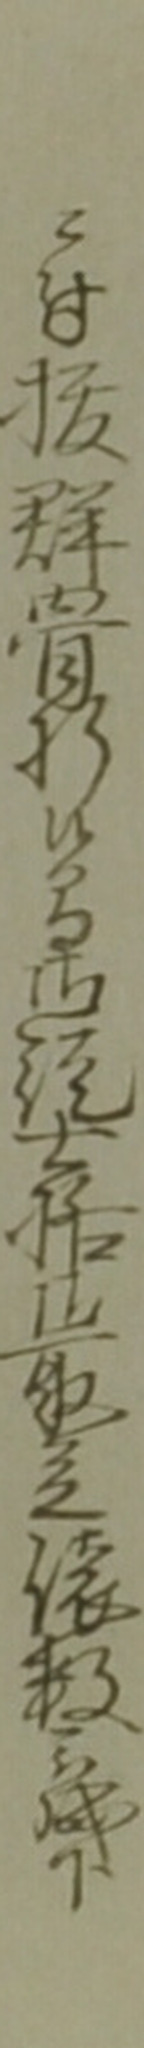ニ付抜群骨折候間御徒士格御取立俵数被成下
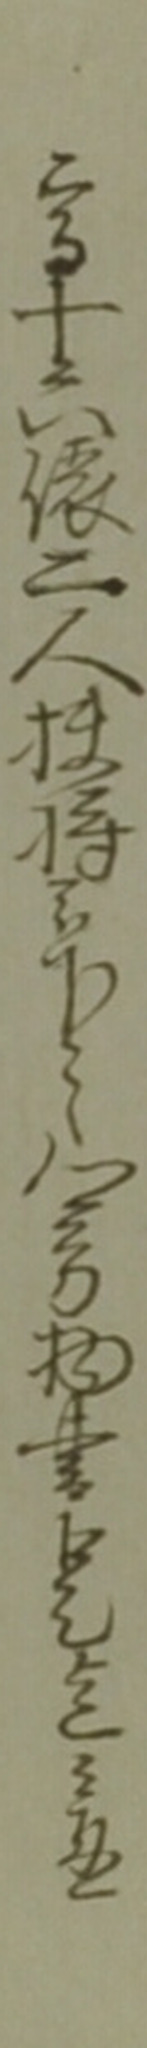高十六俵二人扶持被下之郷組物書是迄之通
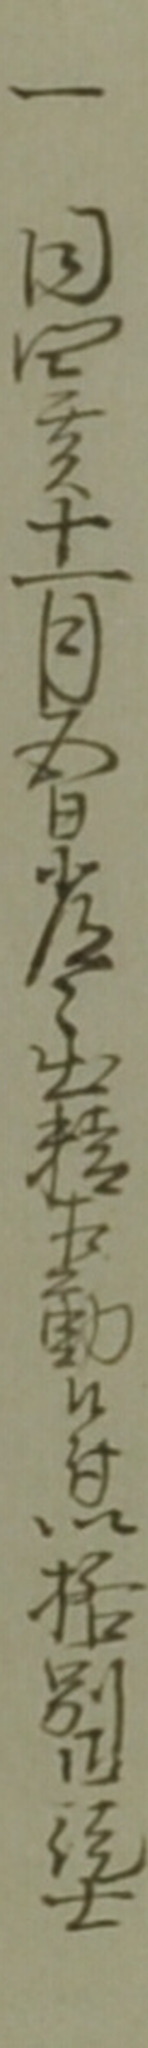一同四亥十一月五日常々出精相勤候付以格別御徒士
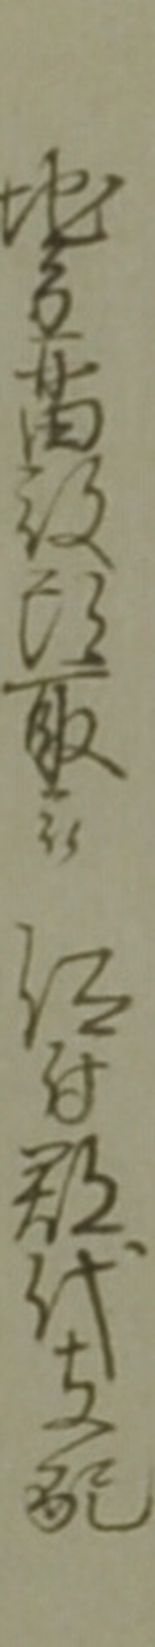地方留役頭取被仰付郡代支配
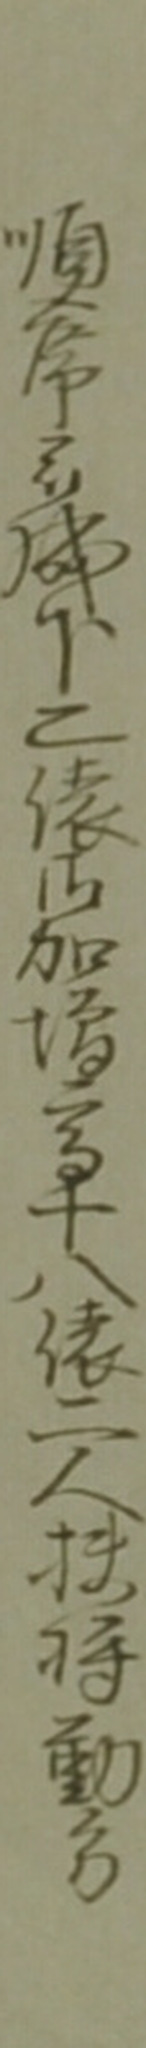順席被成下二俵御加増高十八俵二人扶持勤方

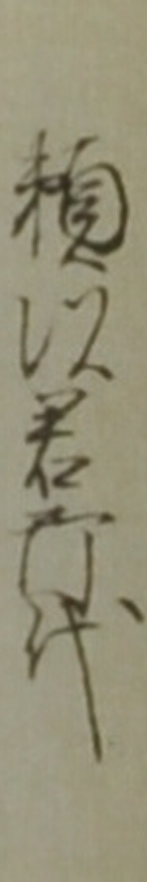頼以君御代
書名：無足諸士勤仕録（八）
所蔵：伊那市立高遠町図書館・合同会社AMANE
